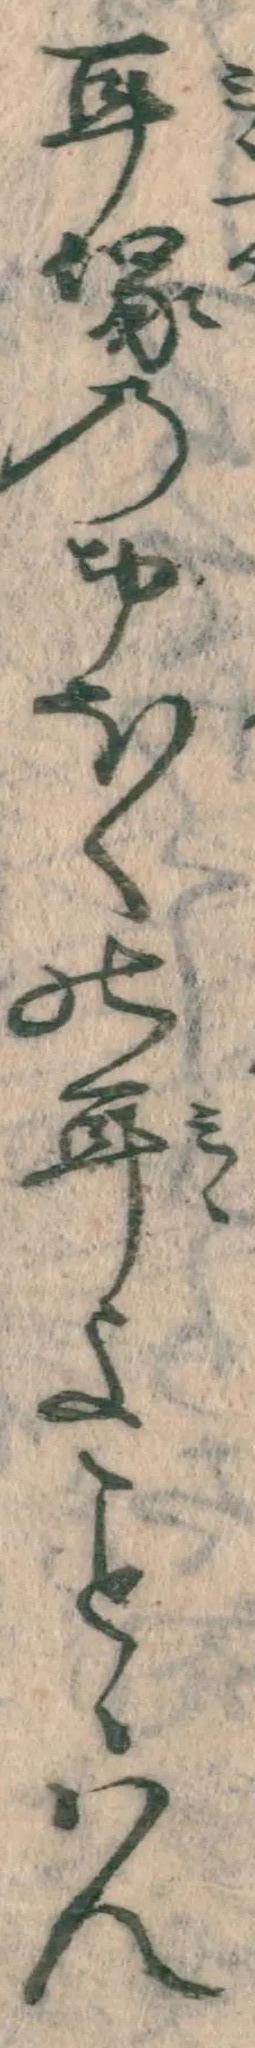耳塚のおほくの耳よことゝはん
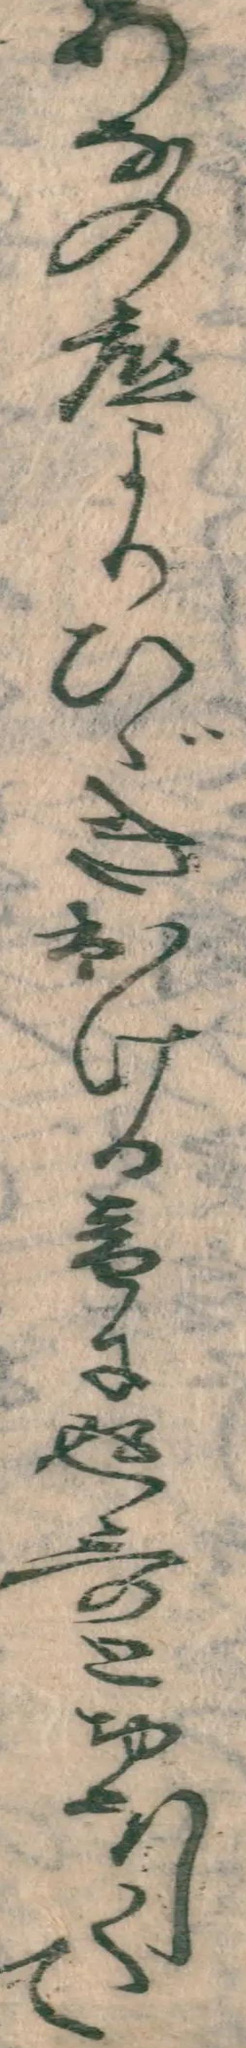あなの底よりひゞき出ける音に返哥とおほしくて
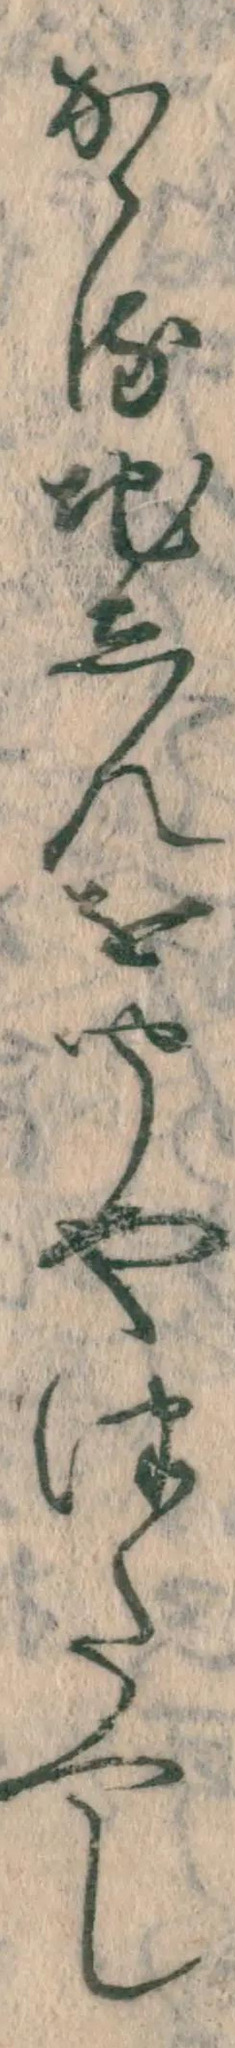かゝる地しんを聞やつたへし
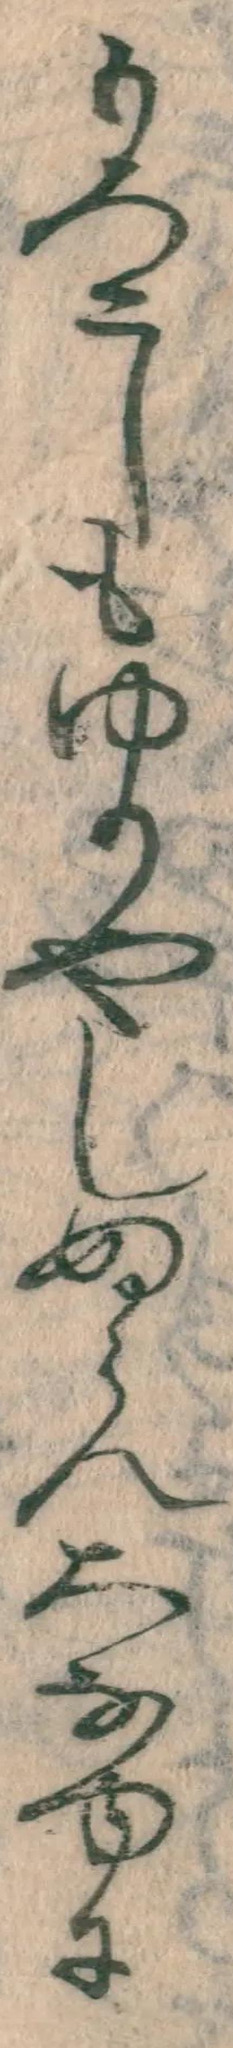もろこしもゆりやしぬらん大なゆに
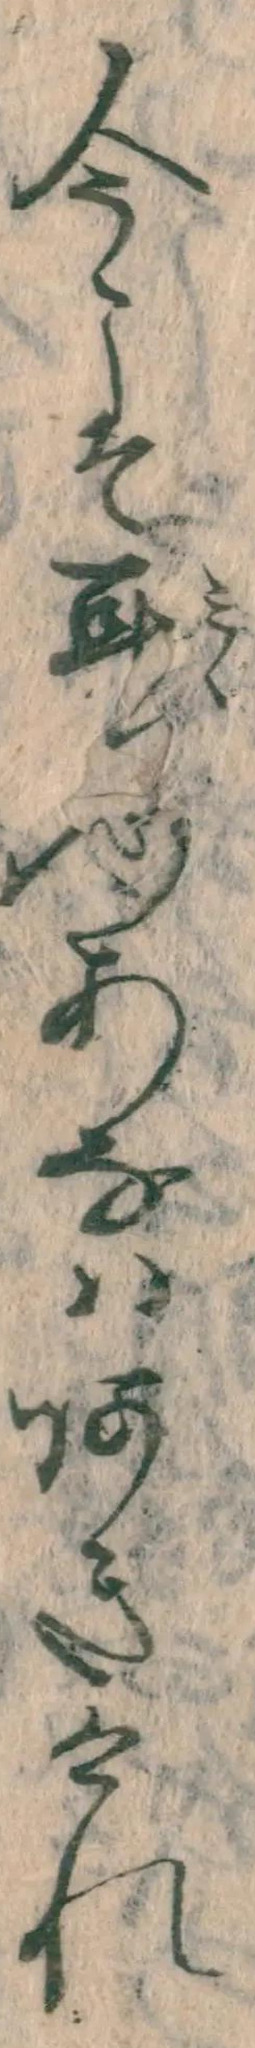今こそ耳のあなはあきけれ

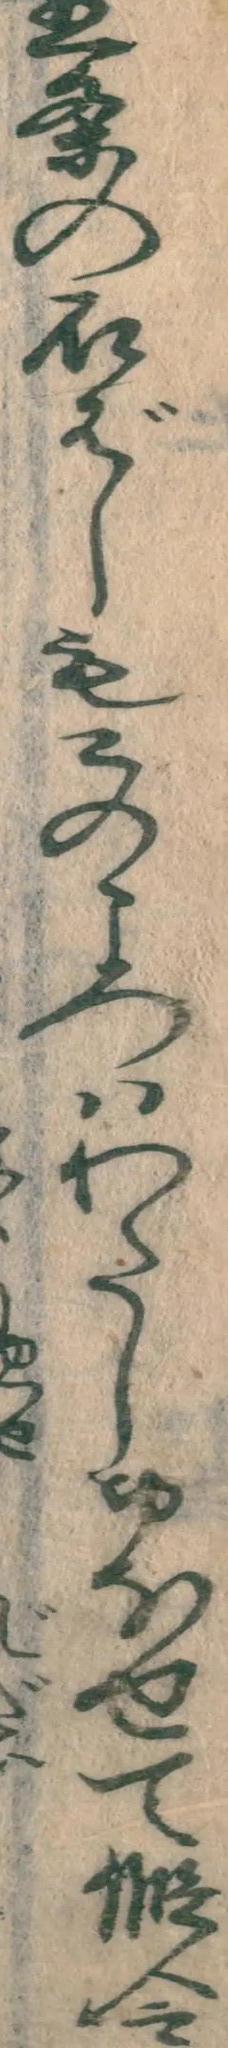五条の石ばしもこのころはわたしおほせて假令
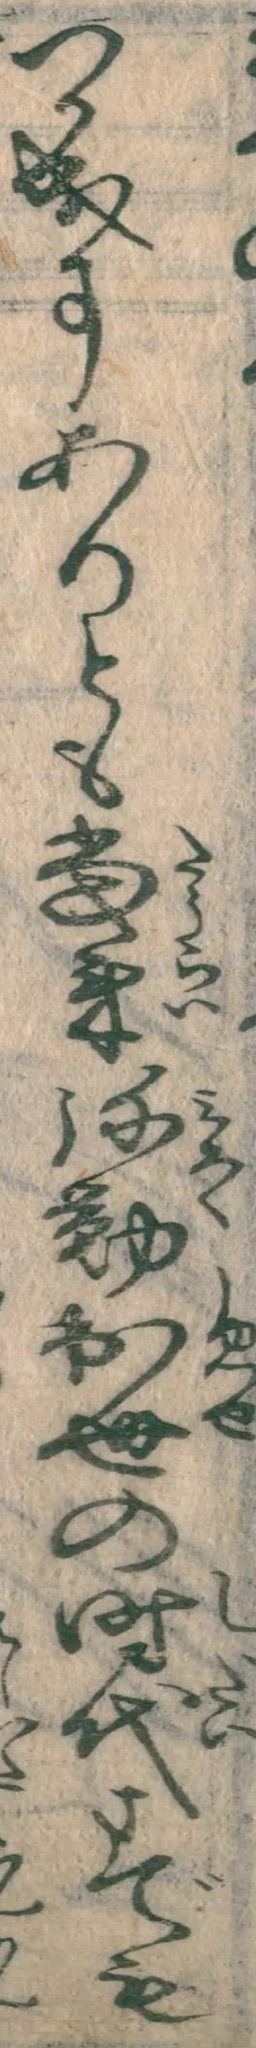つか成事ありとも当来弥勒出世の時代までも
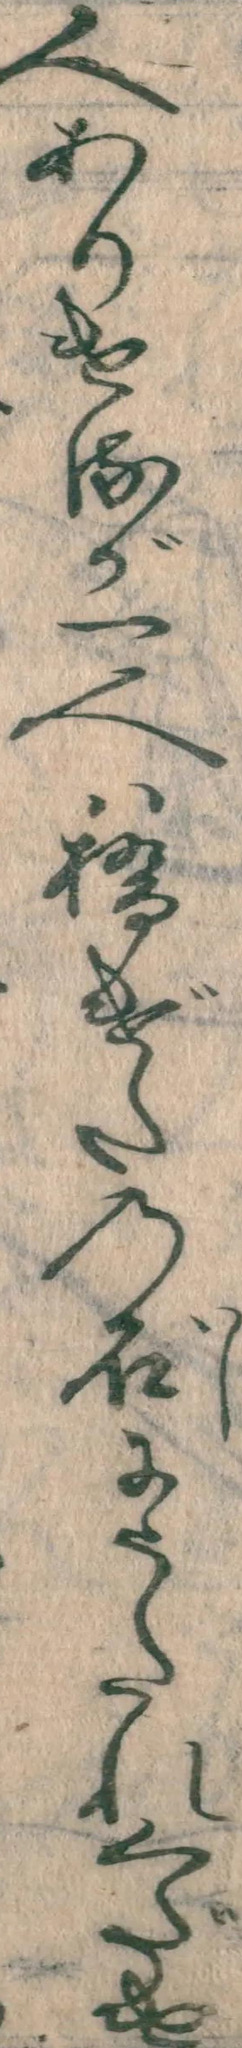人ありけるが一人は橋げたの石にうたれくだけ
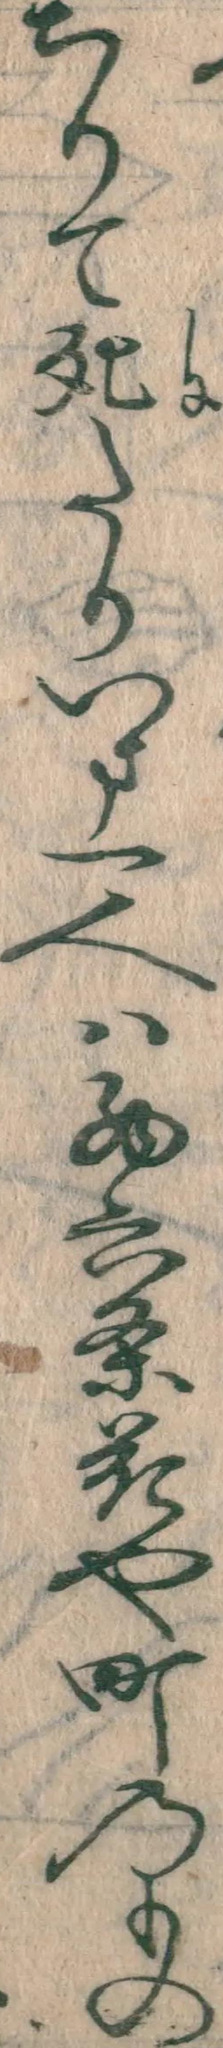ちりて死たりいま一人は西六条花や町のもの
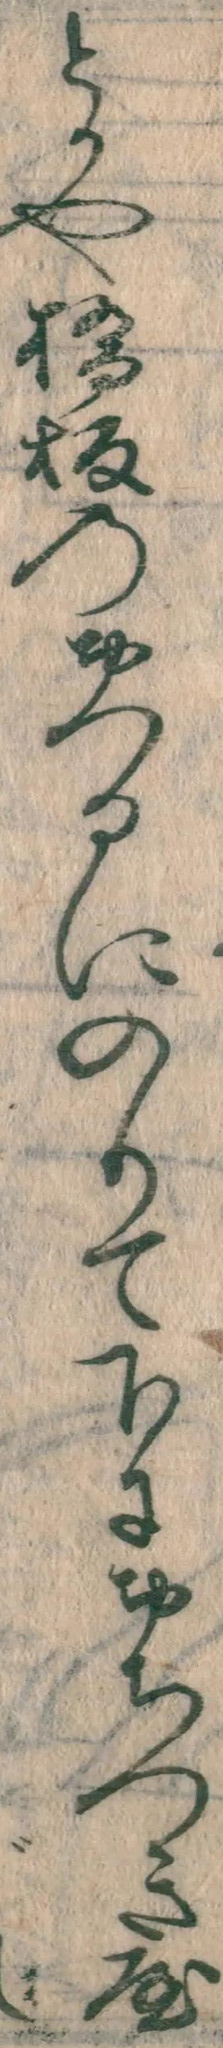とかや橋板のおつるにのりて下におちつきや
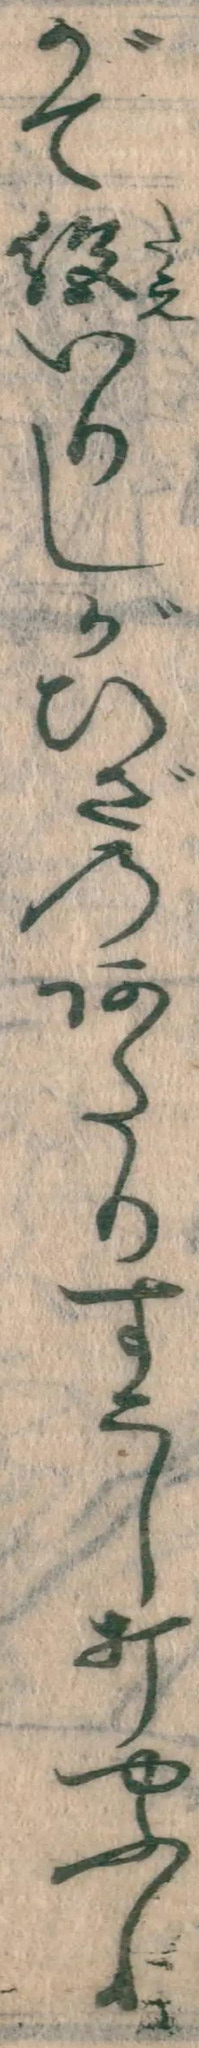がて絶いりしがひざのあたりすこし打やぶれ
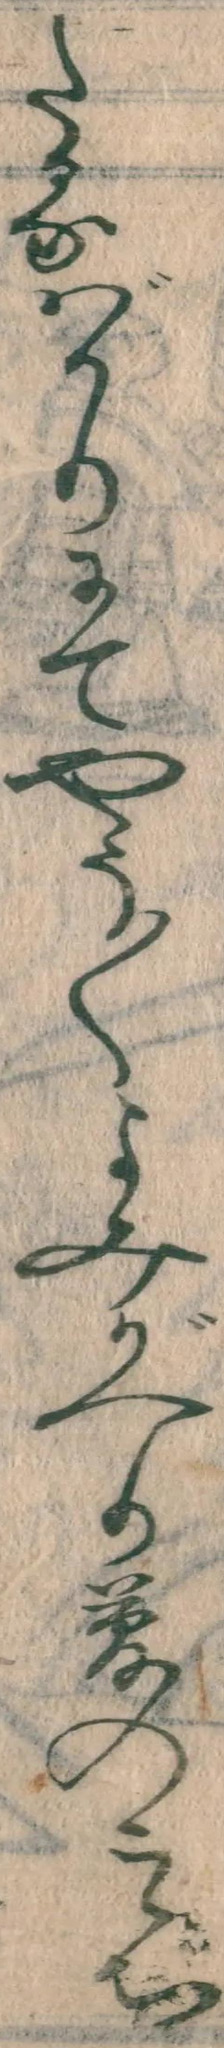たるばかりにてやう〳〵よみがへり夢のこゝち
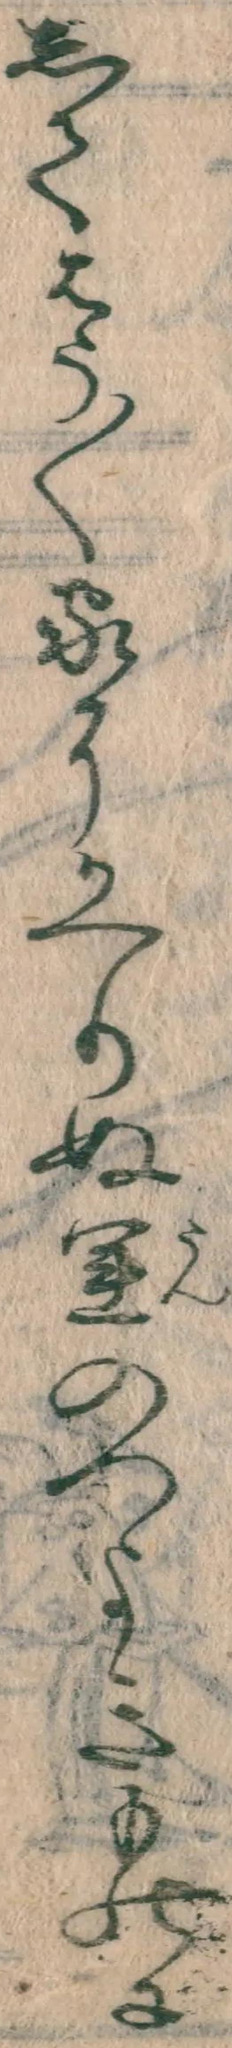してはう〳〵家にかへりぬ運のつよきものに
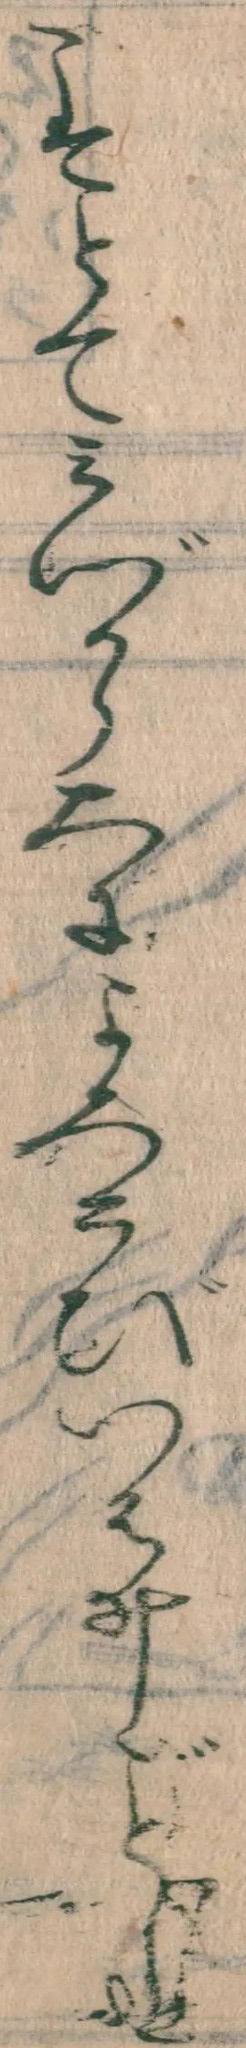こそとてみづから大によろこびいはゐごとしけ
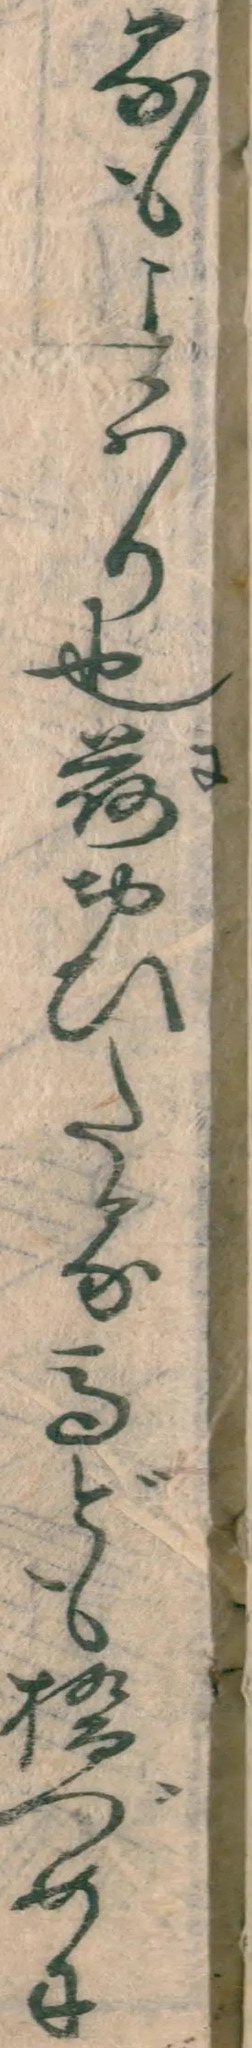るもことはり也荷おひたる馬ども橋づめに
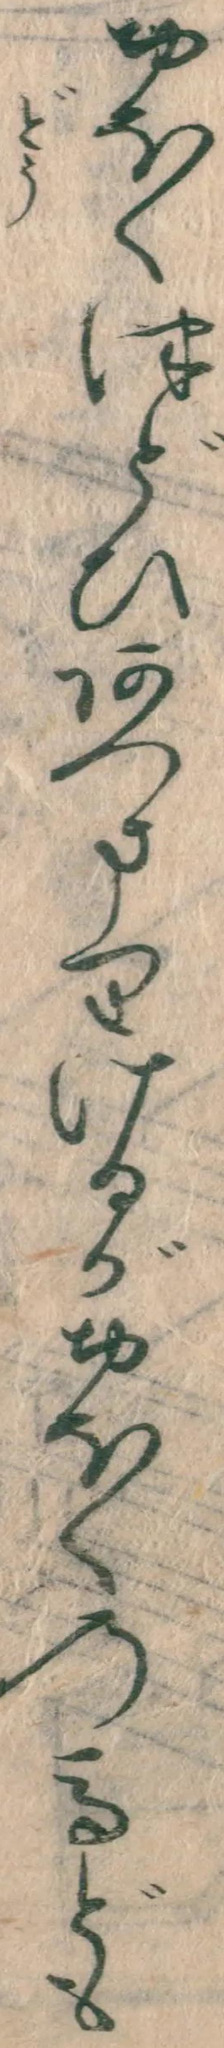おほくつどひあつたりけるがおほくの馬ども
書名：艱難目異志. 上,下
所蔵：国立国会図書館 National Diet Library, JAPAN
